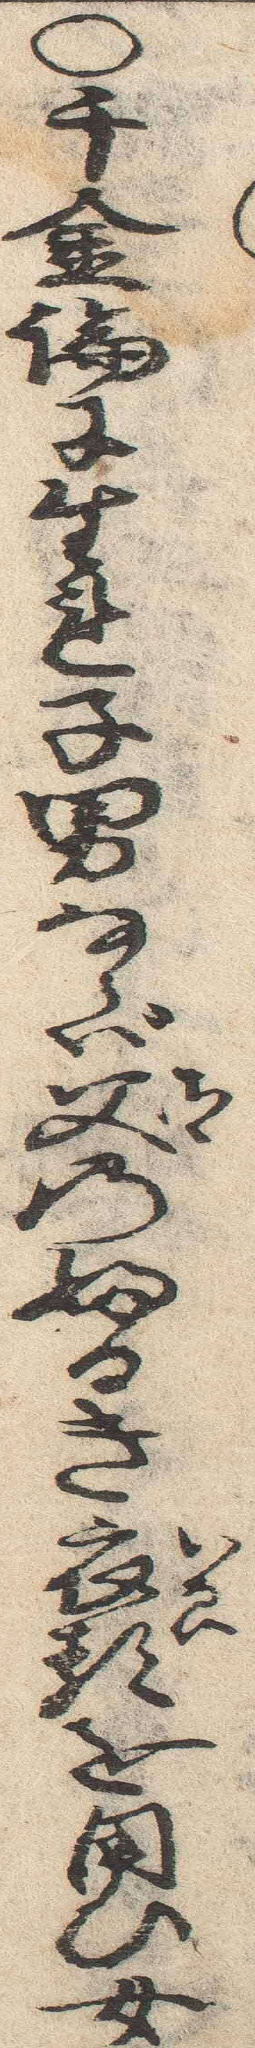◯千金偏に生れ子男ならば父のふるき衣類を用ひ女
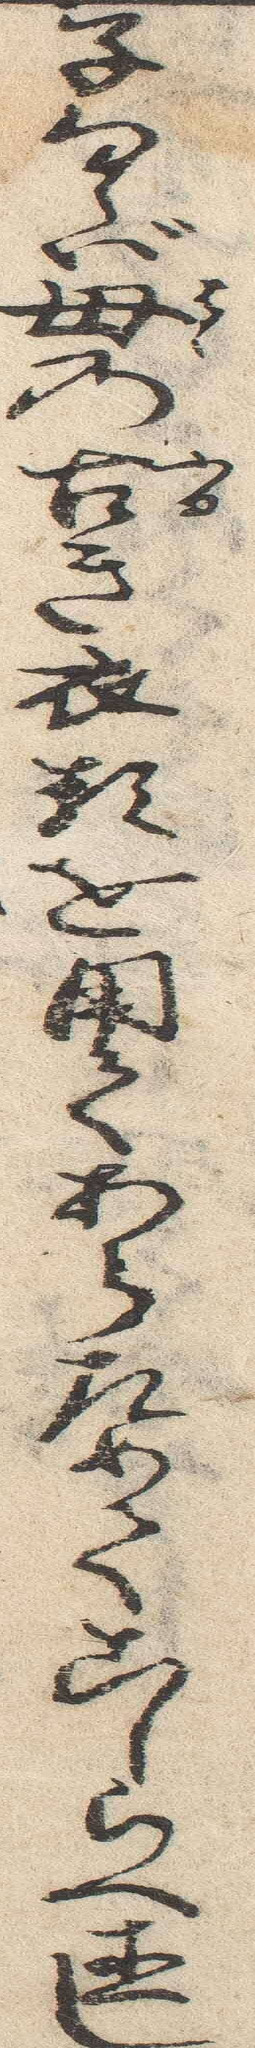子ならば母の古き衣類を用てあらためてこしらへ直し
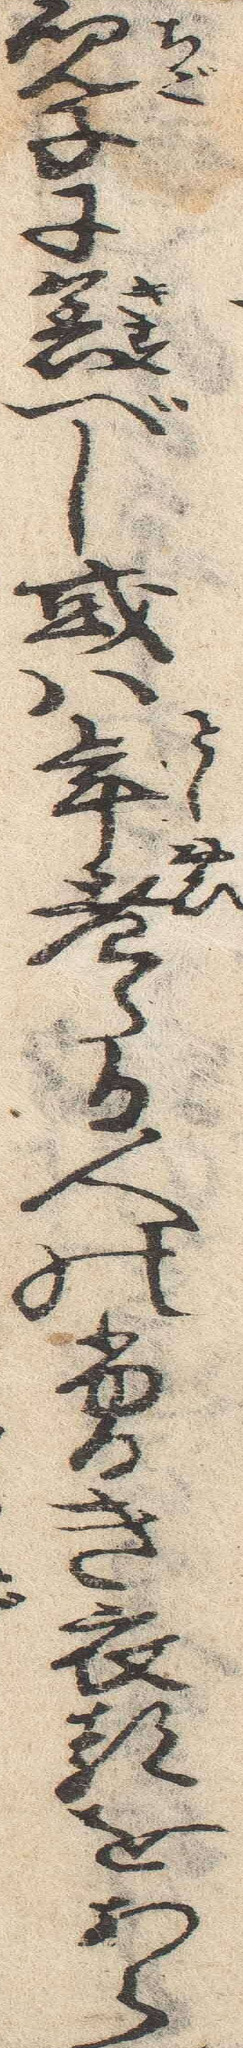児子に着べし或は年老たる人のふるき衣類をあら
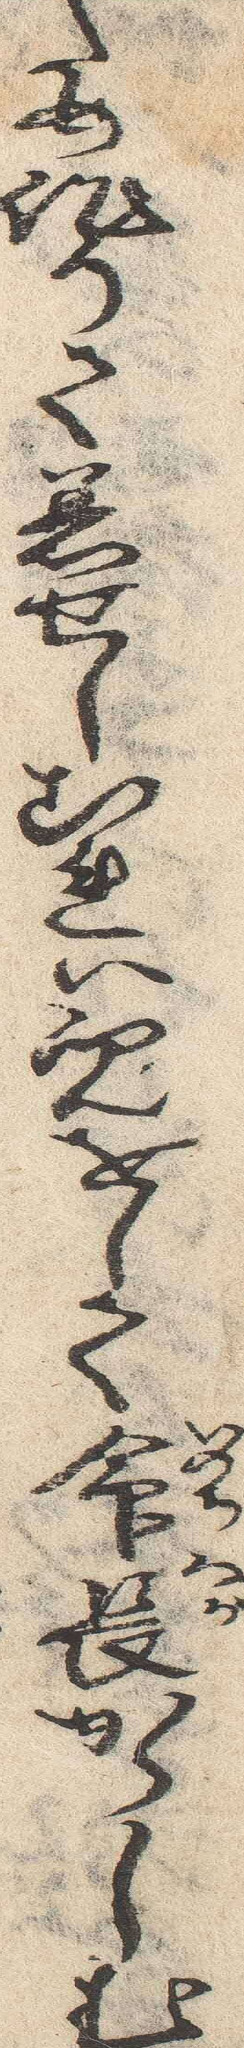ため作りて着せしむれは児をして命長からしむ
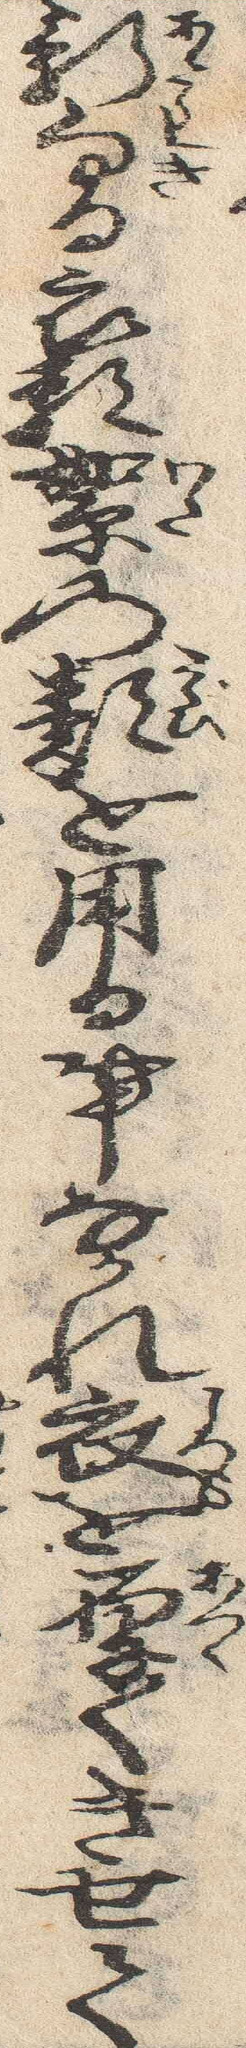新なる衣類絮の類を用る事なかれ衣を厚くきせて
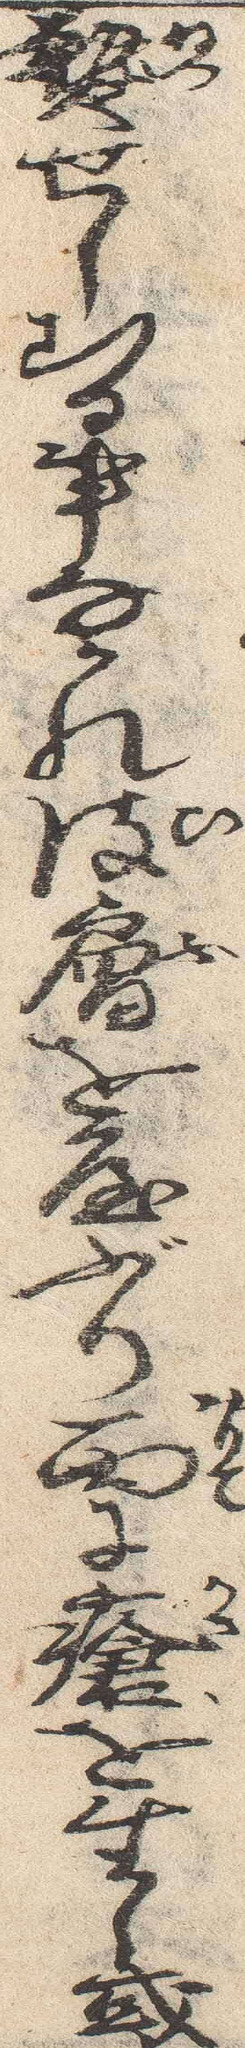熱せしむる事なかれ皮膚をやぶり面に瘡を生し或
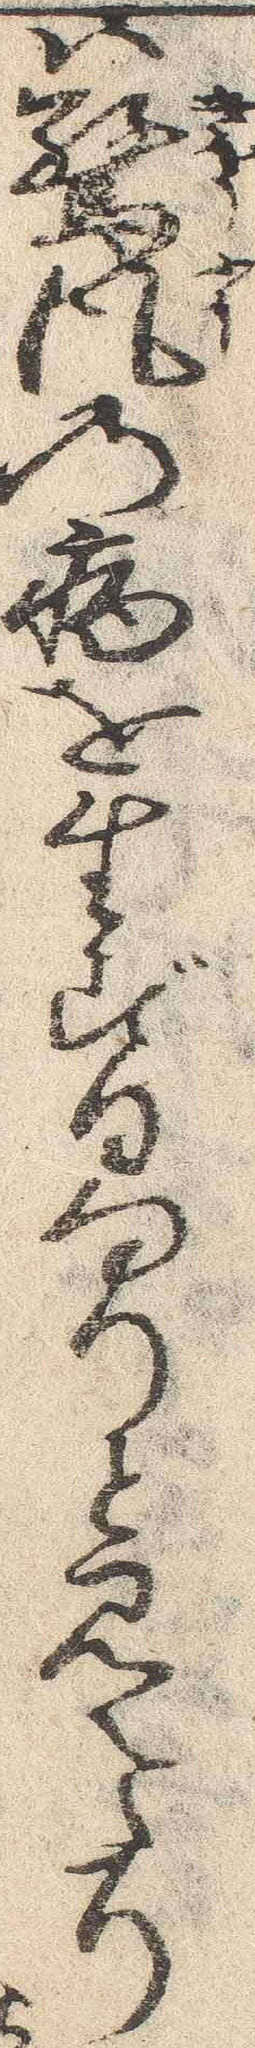は驚風の病を生ずるなりと見えたり
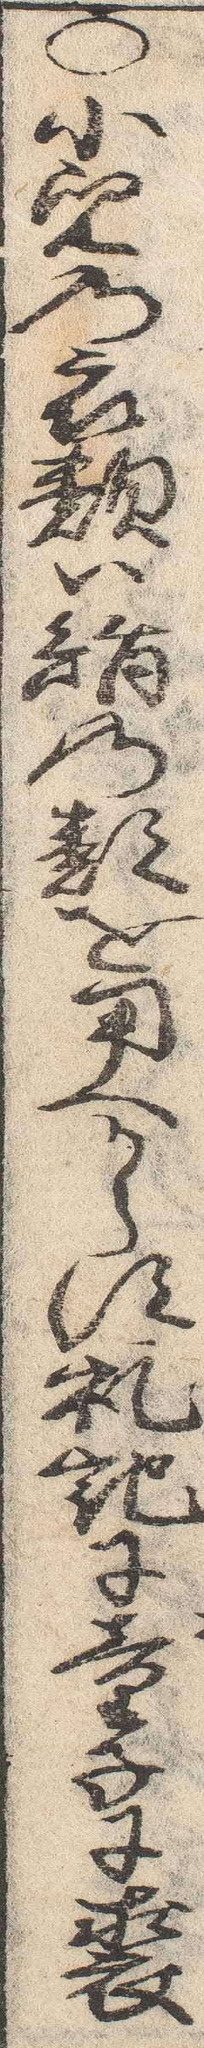◯小児の衣類は絹の類を用へからす礼記に童子に裘
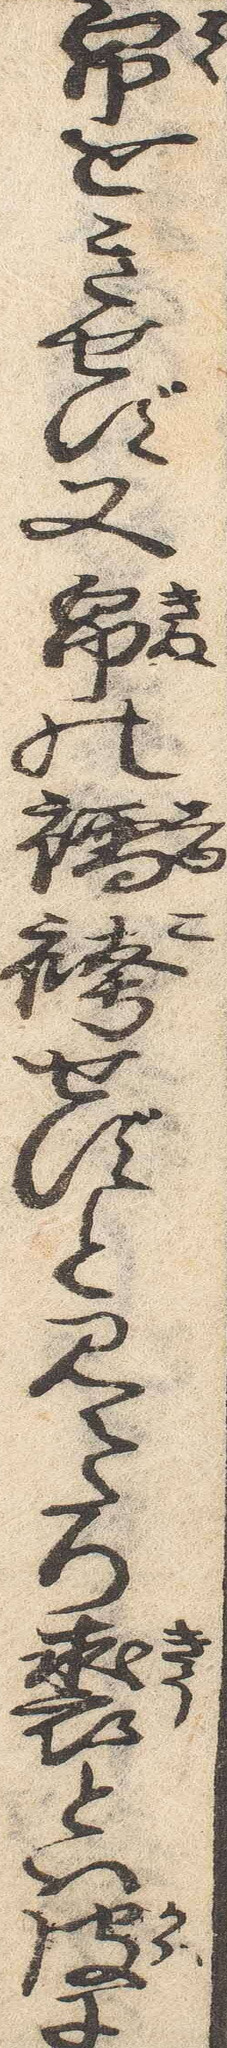帛をきせず又帛の襦袴せずと見えたり裘とは皮に
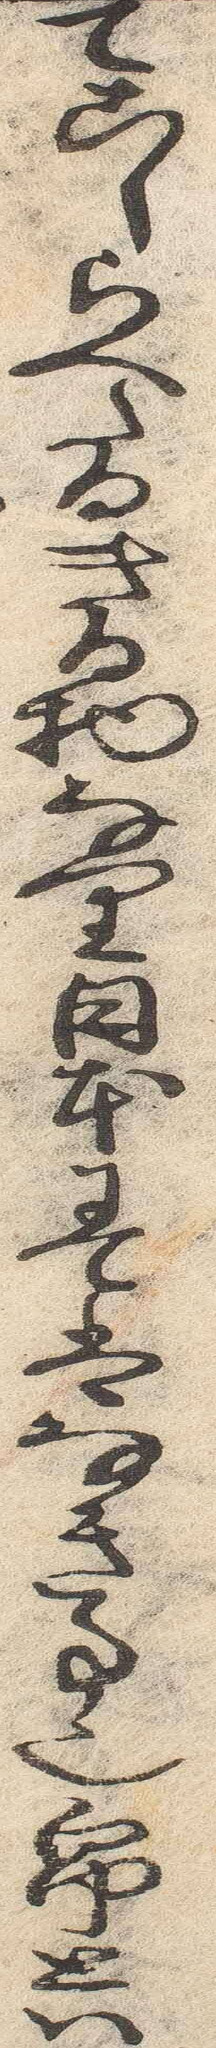てこしらへたるきる物なり日本にてはなき事也帛とは
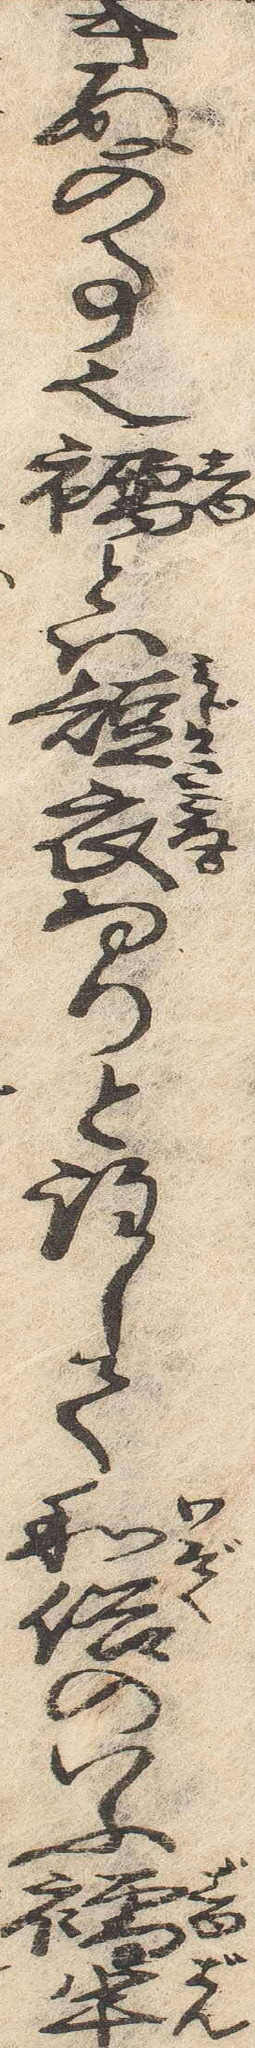きぬの事也襦とは短衣なりと註して和俗のいふ襦半
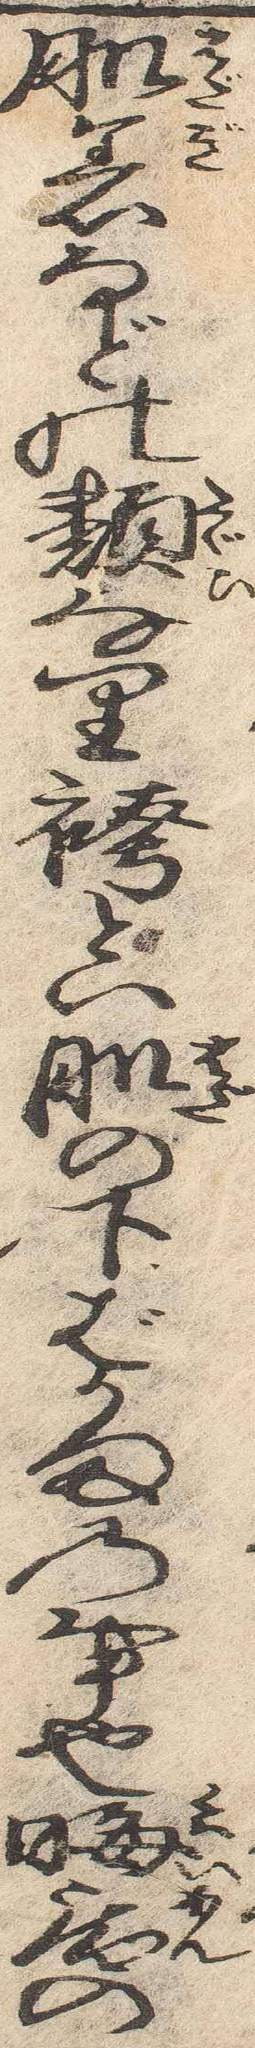肌着などの類なり袴とは肌の下ばかまの事也晦庵の
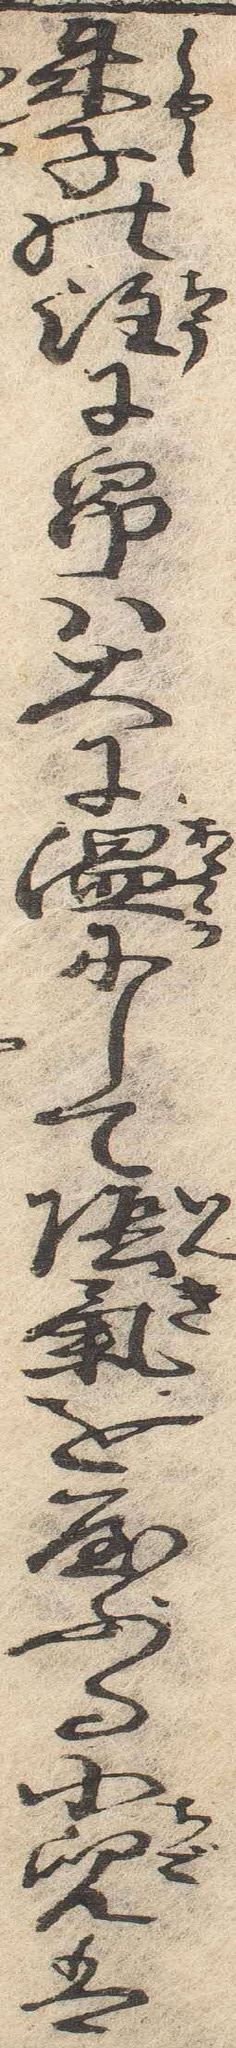朱子の註に帛は大に温にして陰氣をやぶる小児は
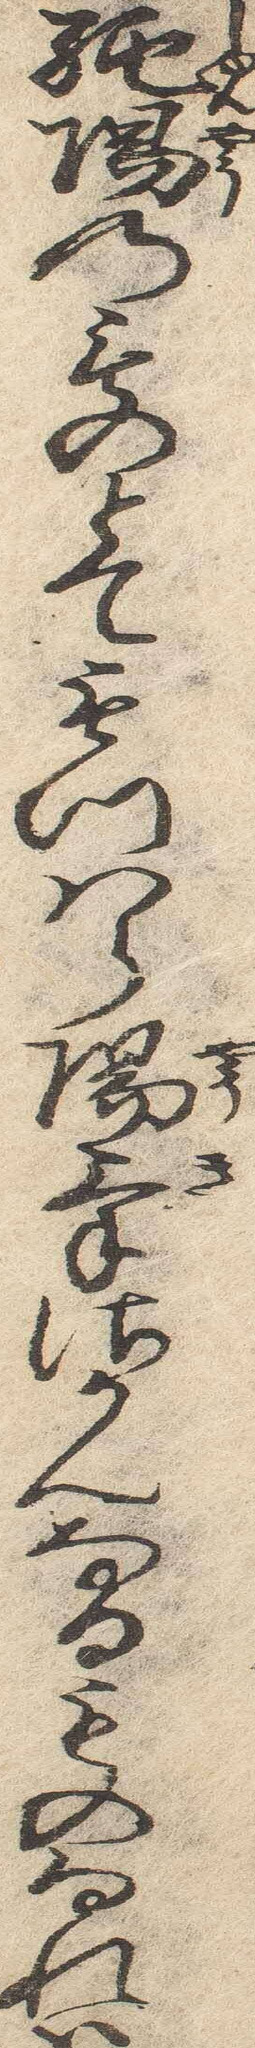純陽のものとてもつはら陽氣さかんなるものなれは
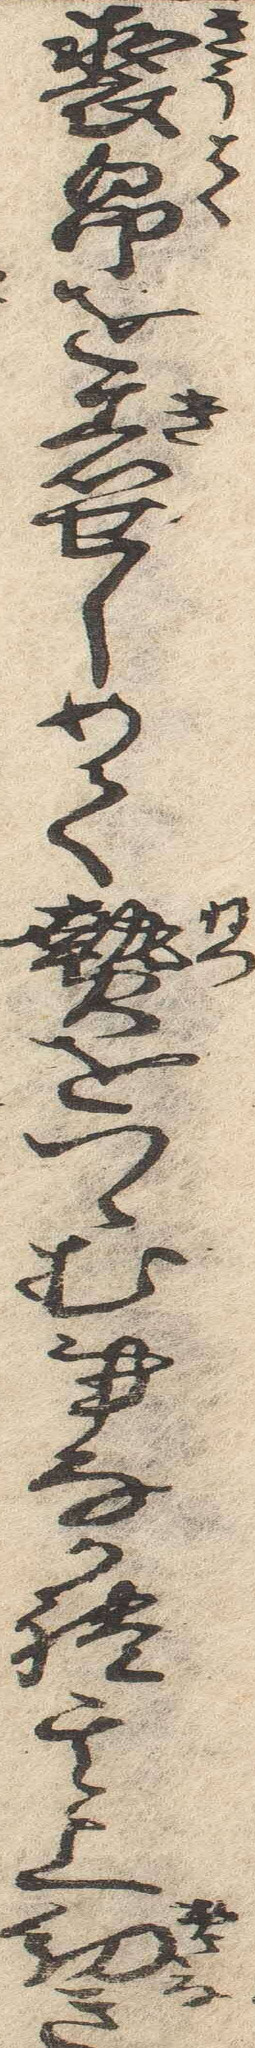裘帛を着せしめて熱をつゝむ事なかれ其上幼き
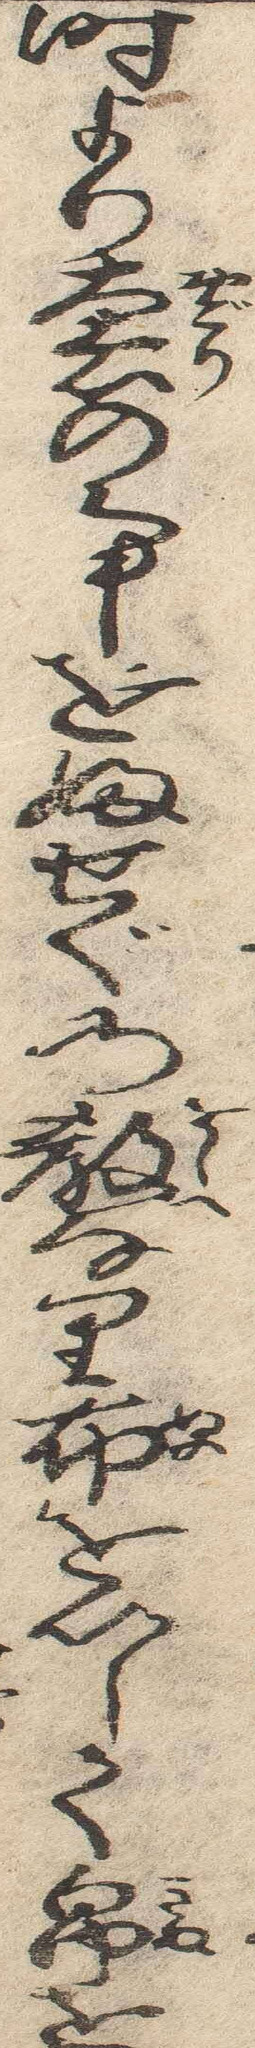時より奢の事をふせぐの教なり布を心して帛を
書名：小児必用養育草
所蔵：東京学芸大学附属図書館 国文学研究資料館
